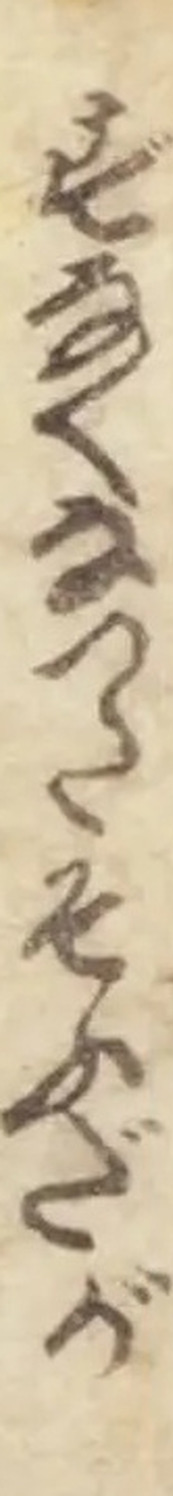ずなくなつたそふだが
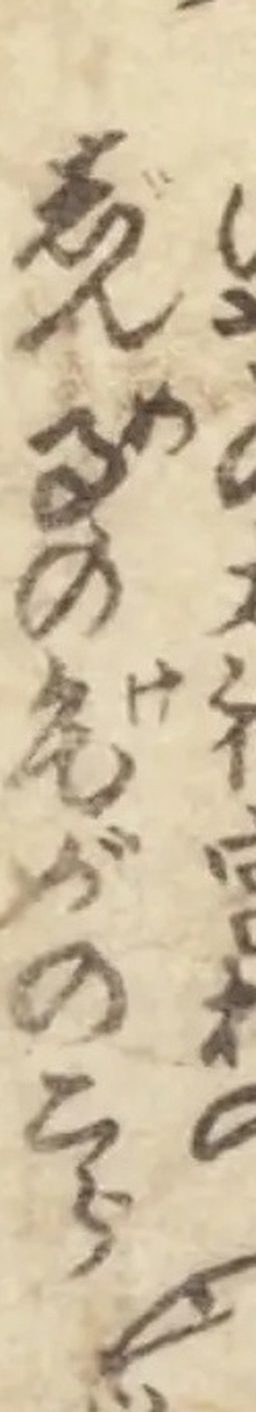しん馬の毛がのこら
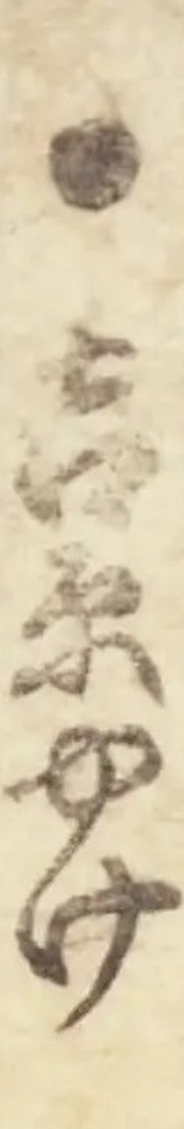●吉原やけ
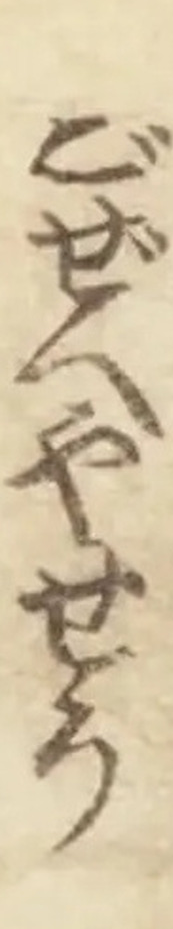ごぜへやせう
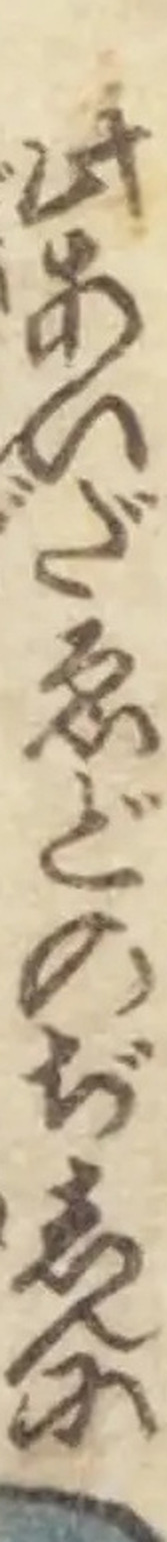此あいだゑどのぢしんに
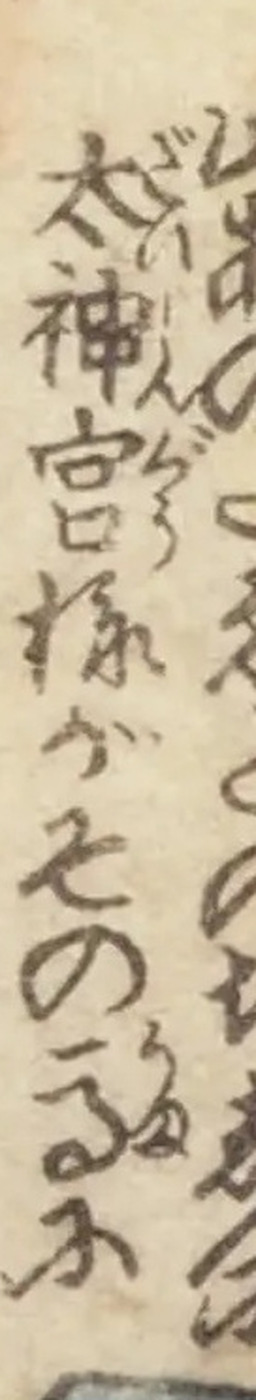太神宮様がその馬に
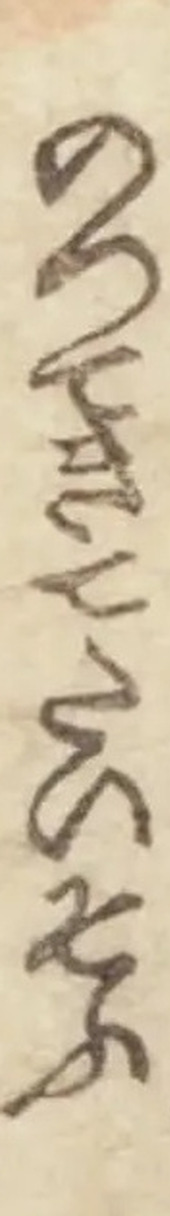のつてきてたいそふ
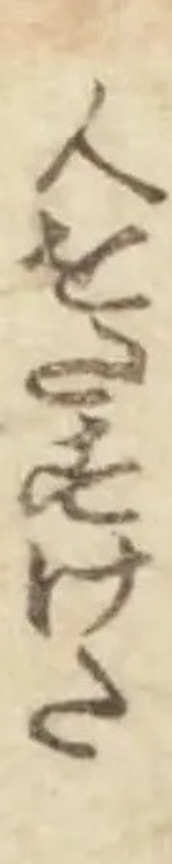人をたすけた
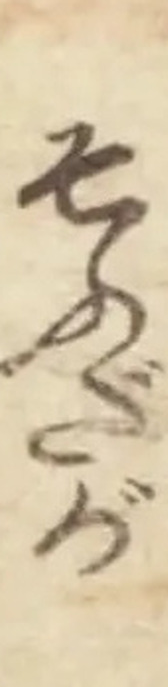そふだが
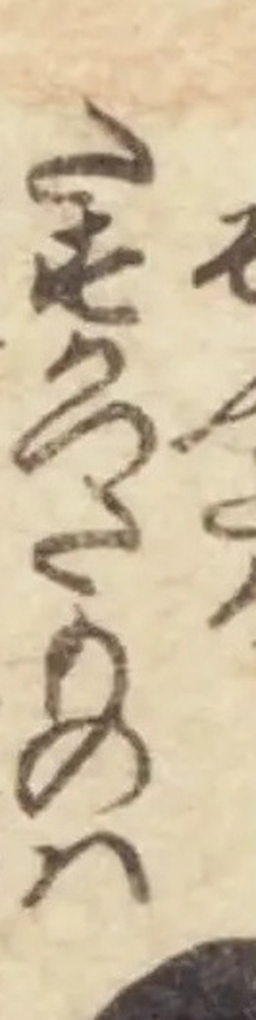たすかつたものは
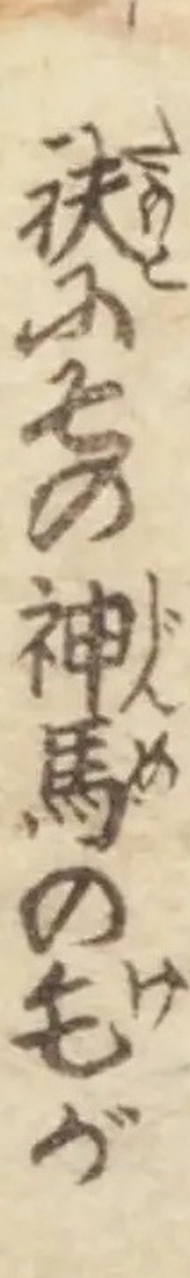袂にその神馬の毛が
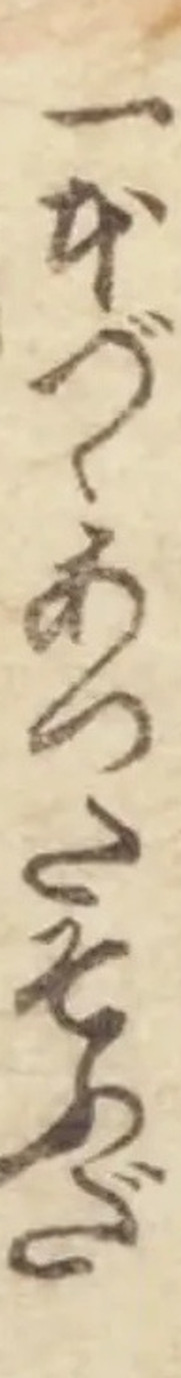一本づゝあつたそふだ
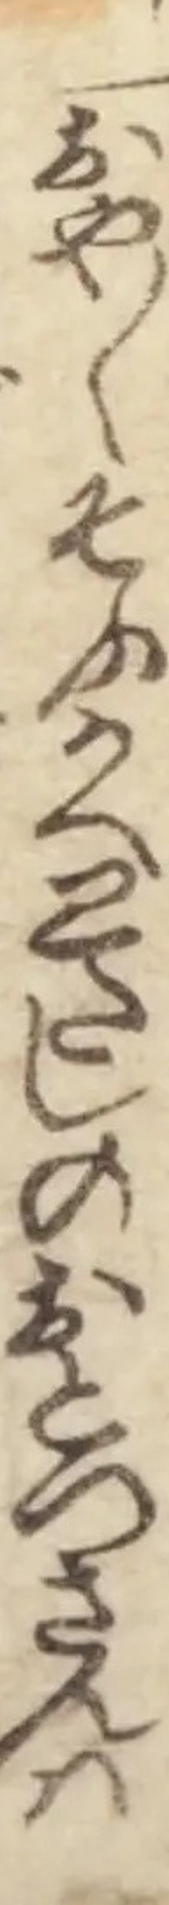「おや〳〵そふかへわたしのおとつさんは
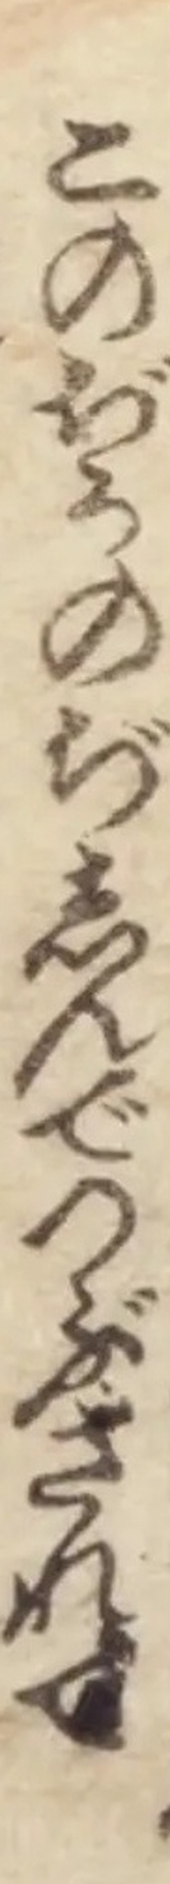このぢかのぢしんでつぶされて
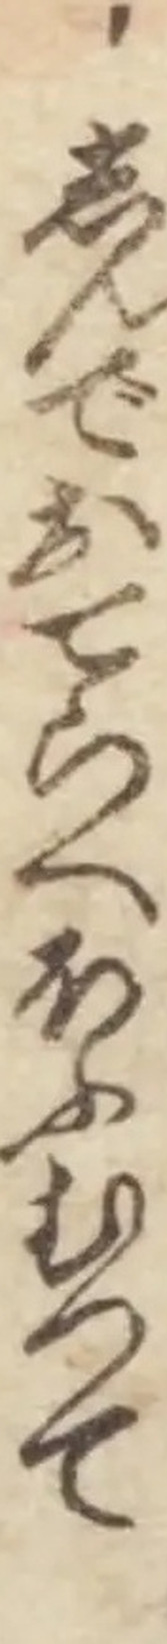しんでおてらへほふむつて
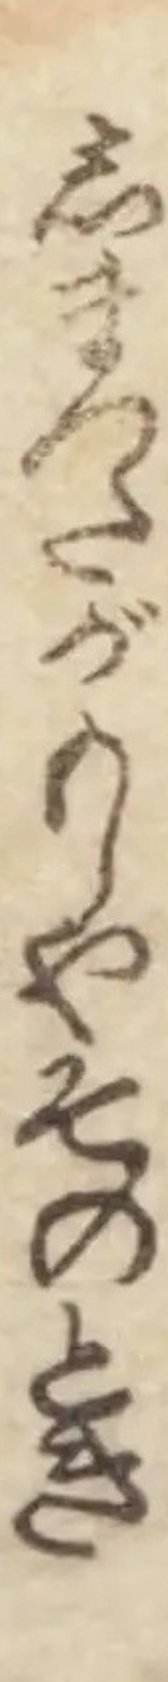しまつたがもしやそのとき
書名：二日はなし地震亭念魚町々庵炎上
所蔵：国立国会図書館 National Diet Library, JAPAN
